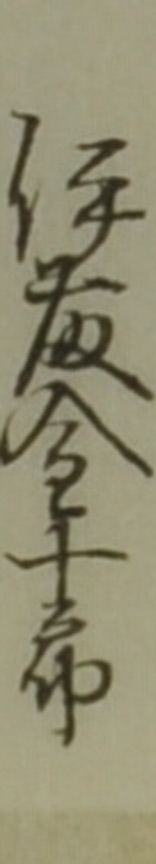伊藤金十郎
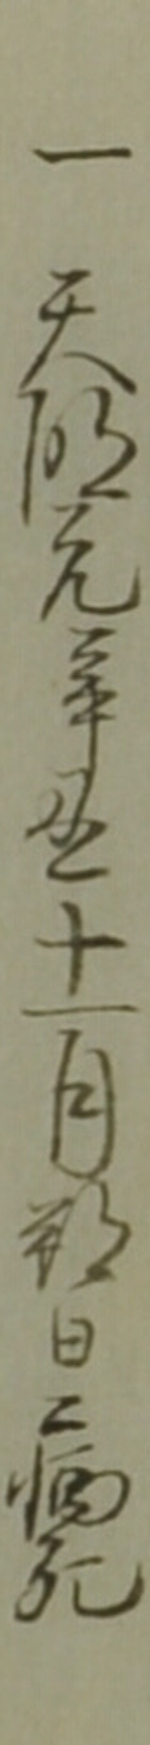一天明元辛丑十一月朔日病死
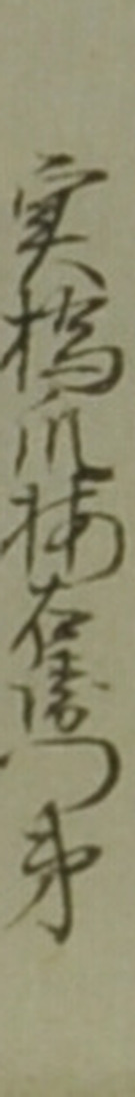実橋爪按右衛門弟
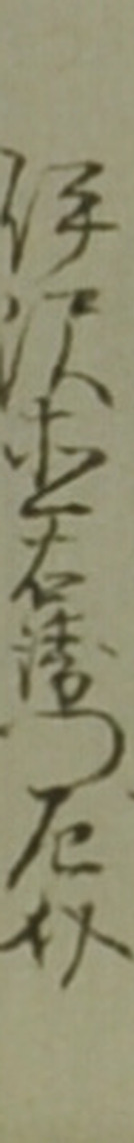伊沢直右衛門厄介
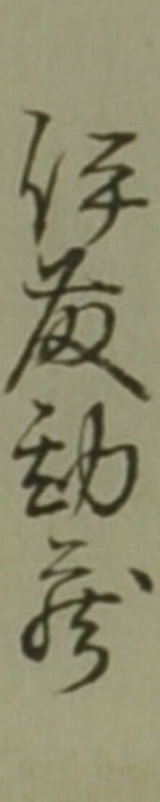伊藤勘蔵
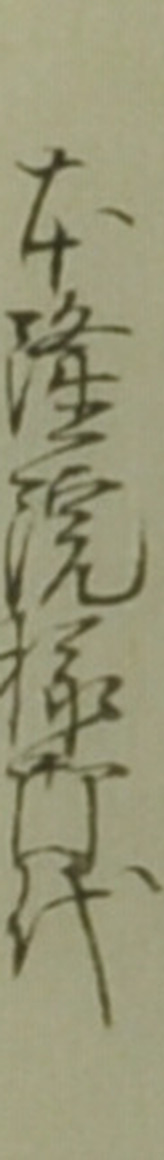本隆院様御代
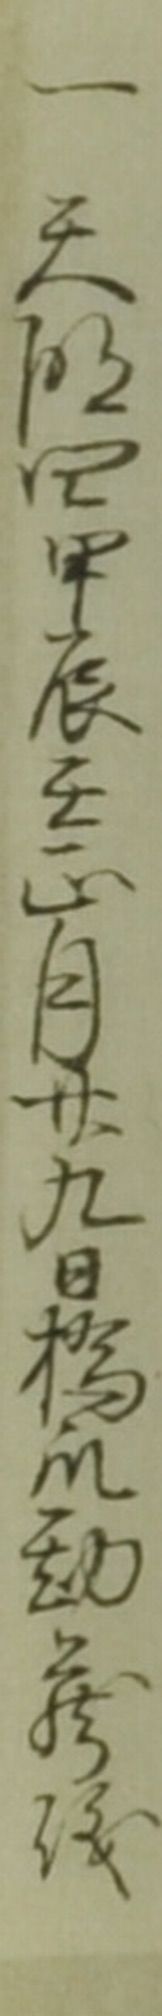一天明四甲辰閏正月廿九日橋爪勘蔵儀

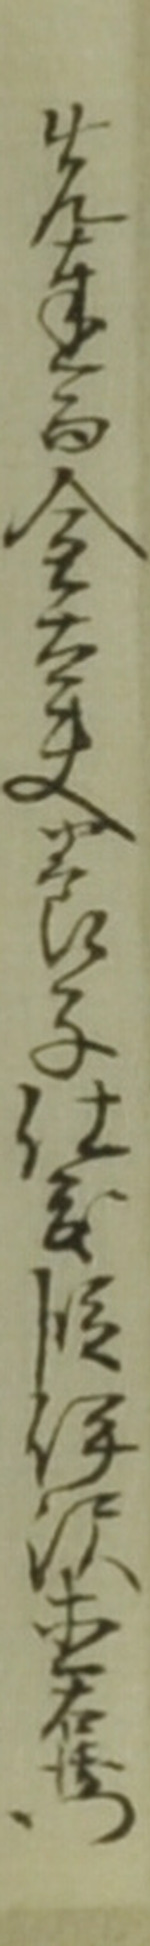先達而金太夫養子仕度段伊沢直右衛門
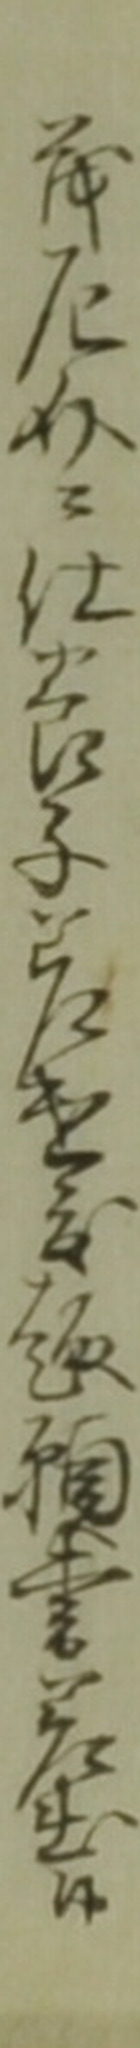茂厄介ニ仕養子差遣度趣願書差出候
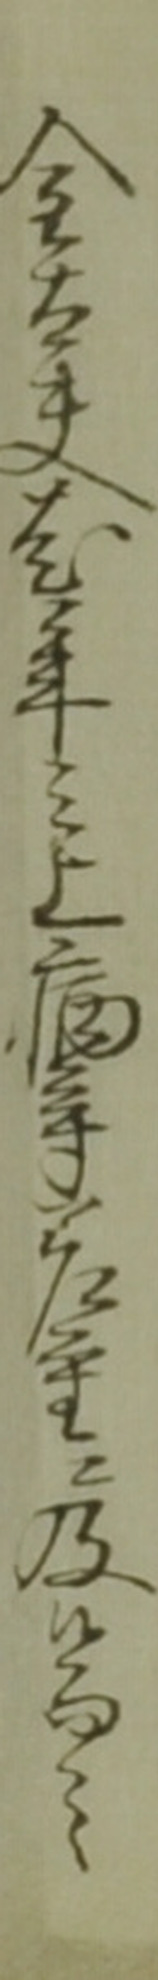金太夫老年之上病気差重ニ及候而之
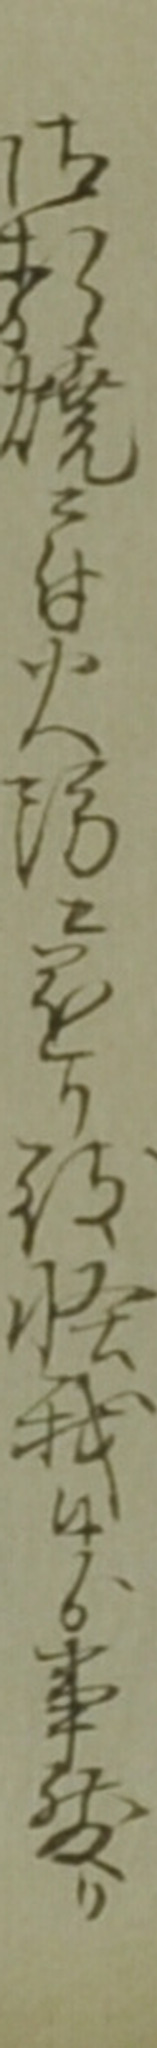御類焼ニ付火防ニ懸リ致怪我候ゟ事発リ
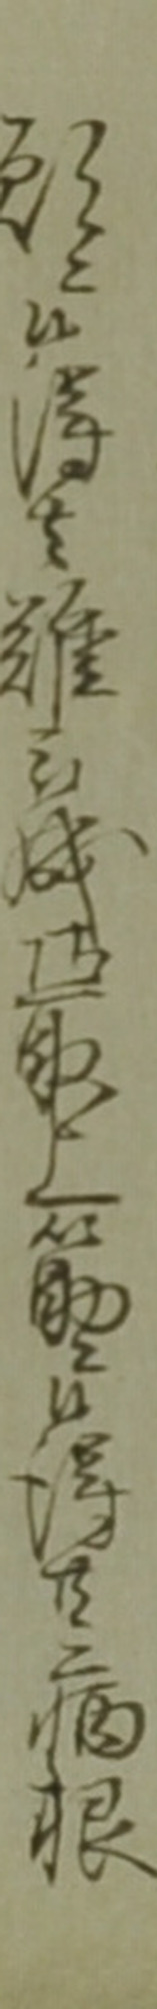願ニ候得者難被成御取上筋ニ候得共病根
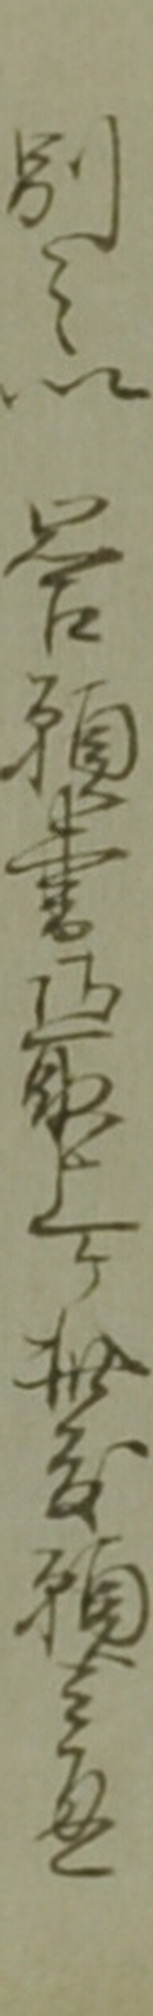別之以思召願書御取上ヶ此度願之通
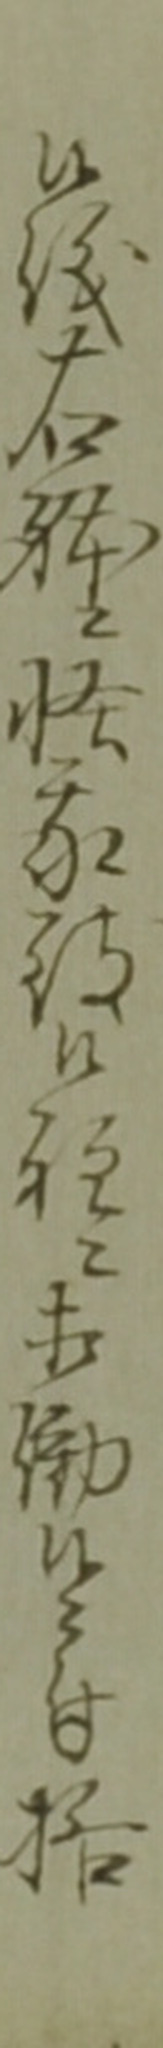候義右躰ニ怪我致候程ニ相働候ニ付格
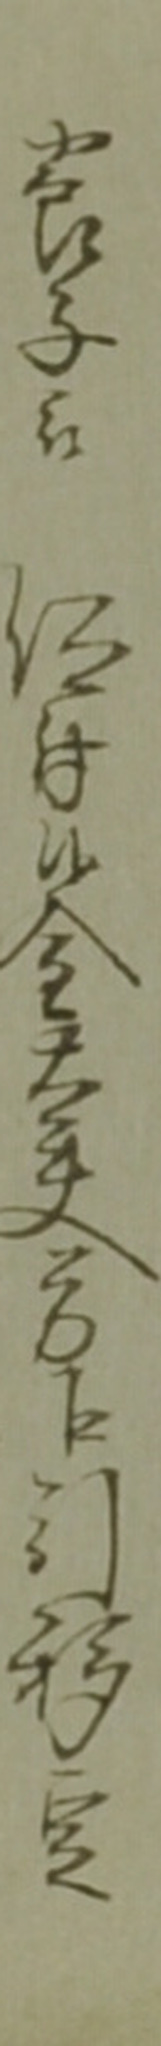養子被仰付候金太夫方江引移定
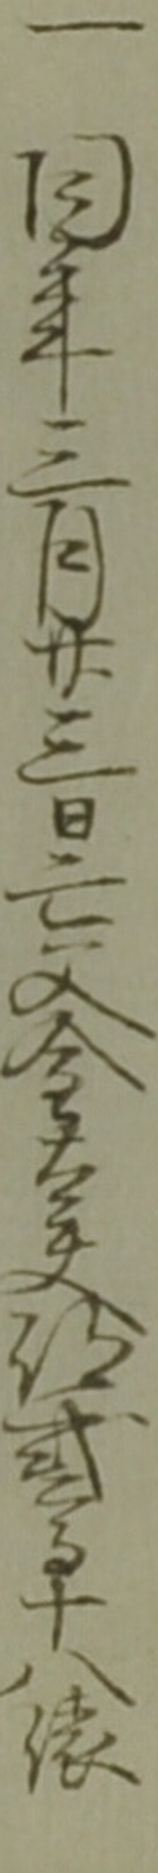一同年三月廿三日亡父金太夫跡式高十八俵
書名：無足諸士勤仕録（一）
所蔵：伊那市立高遠町図書館・合同会社AMANE
